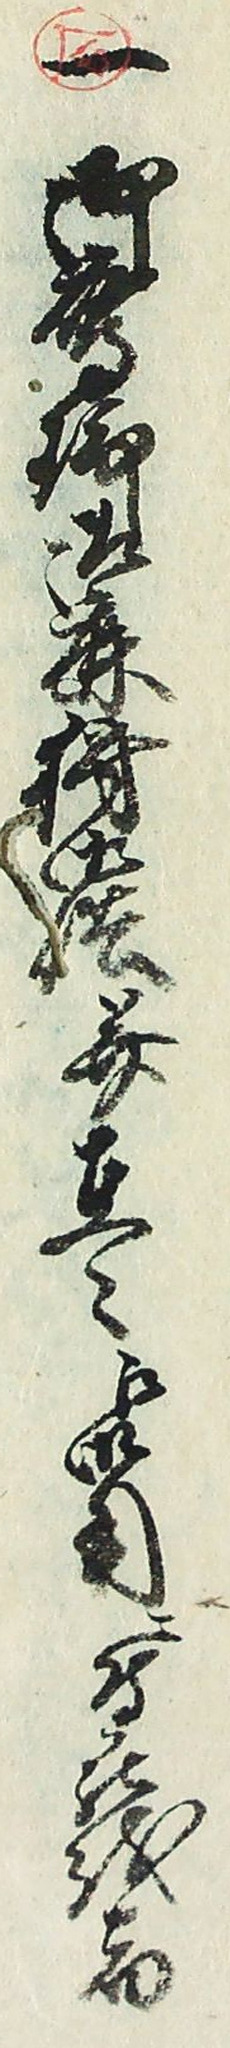一御鷹野御鹿狩御供幷在々え御用に付罷越宿者
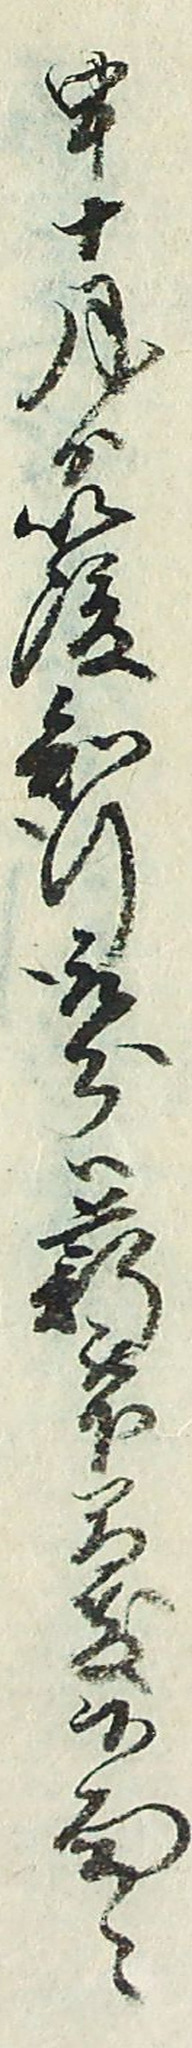申十月より以後知行所分は薪被下間敷候面々
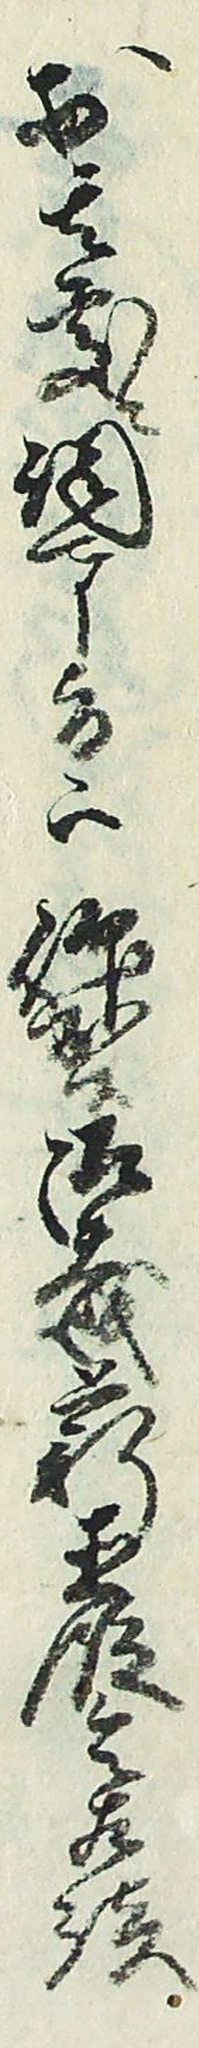於其処に調可申旨被仰出候御蔵薪直段令相談
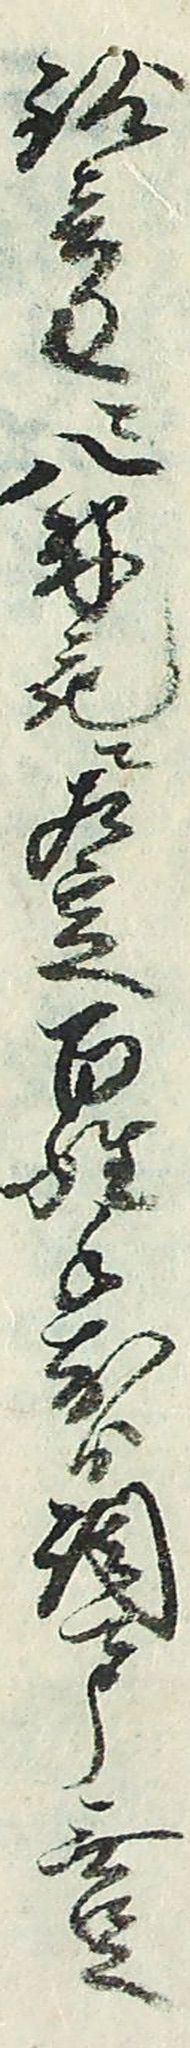銀一匁に八束宛に相定百姓手前より調可申候無足
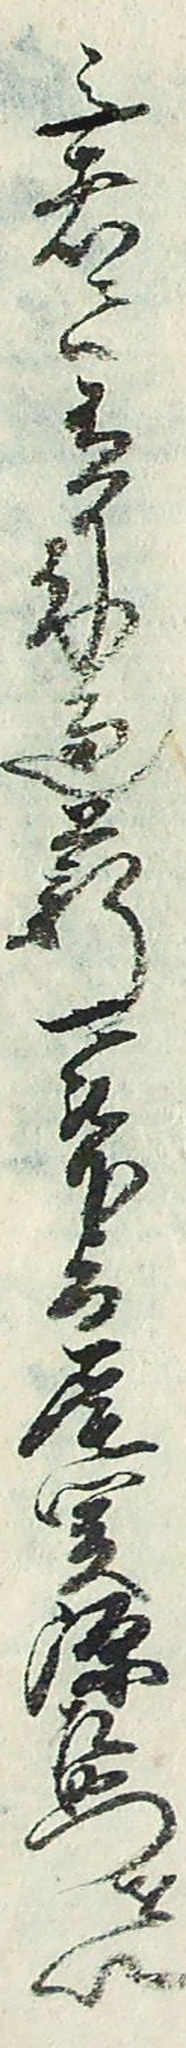の者には有来通薪可被下旨尾関源左衛門を以

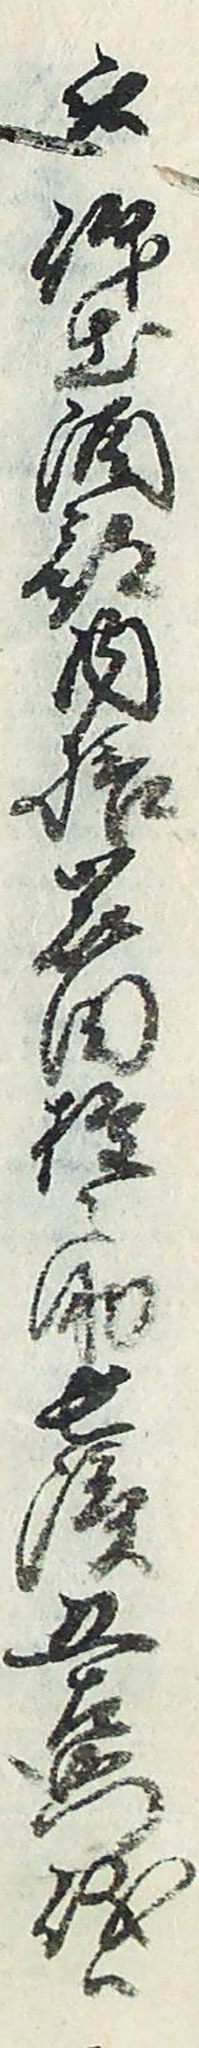被仰出酒部内膳岩田権之助長浜五左衛門儀は
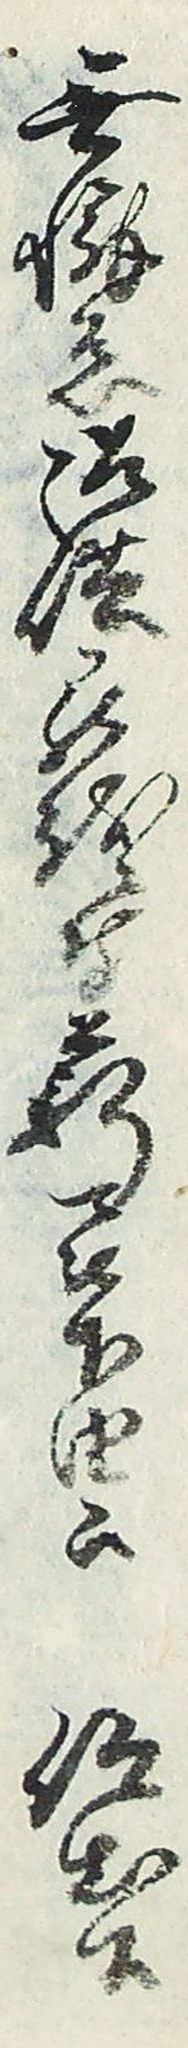無懈怠御供罷越に付薪可被下由被仰出候
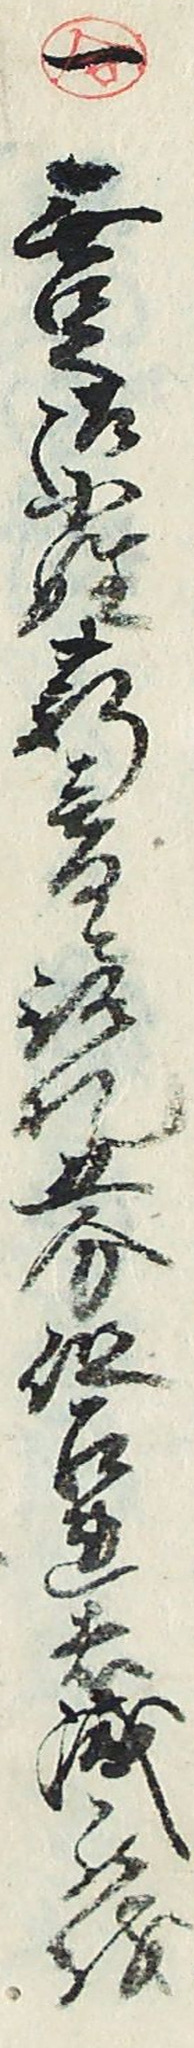一無足御小姓薪一日に銀札五分但召連者減罷越
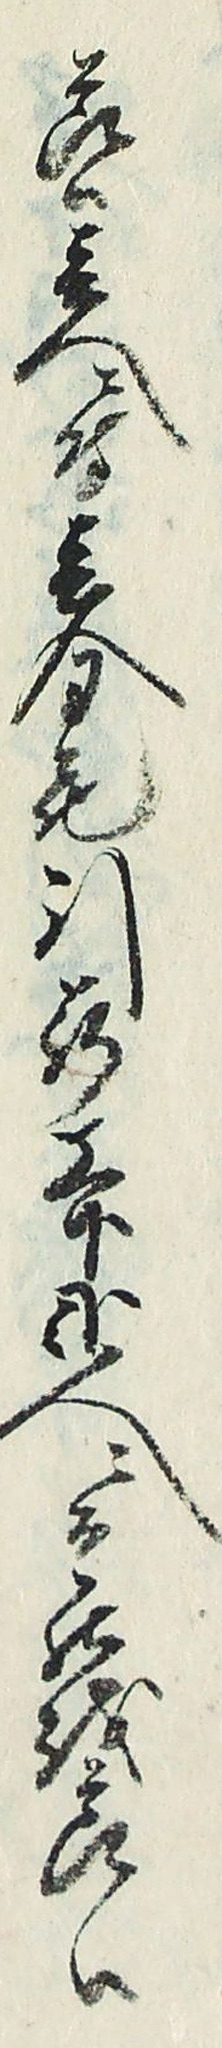節は一人に付一分宛引若上下二人にて罷越節は
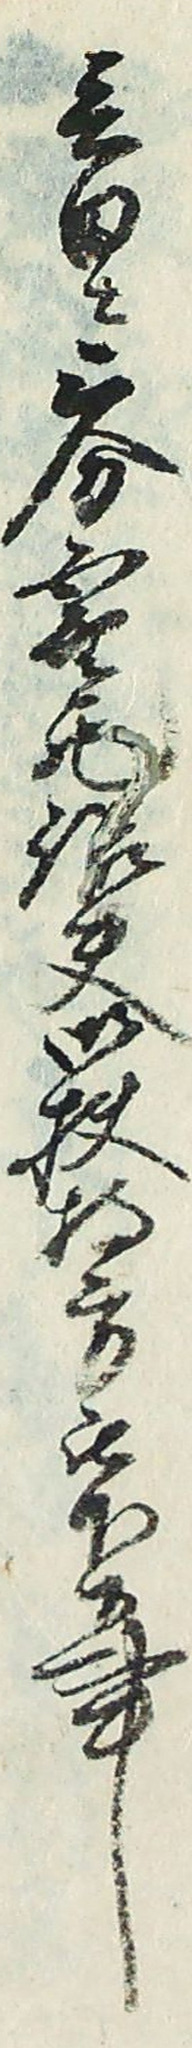一日に三分五厘宛詰夫御扶持方被下候事
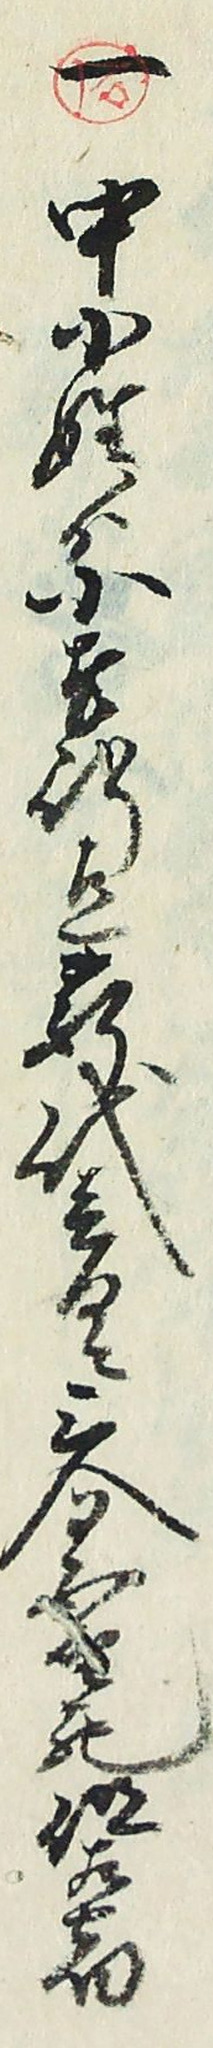一中小姓より小奉行迄薪代一日に三分五厘宛但相宿
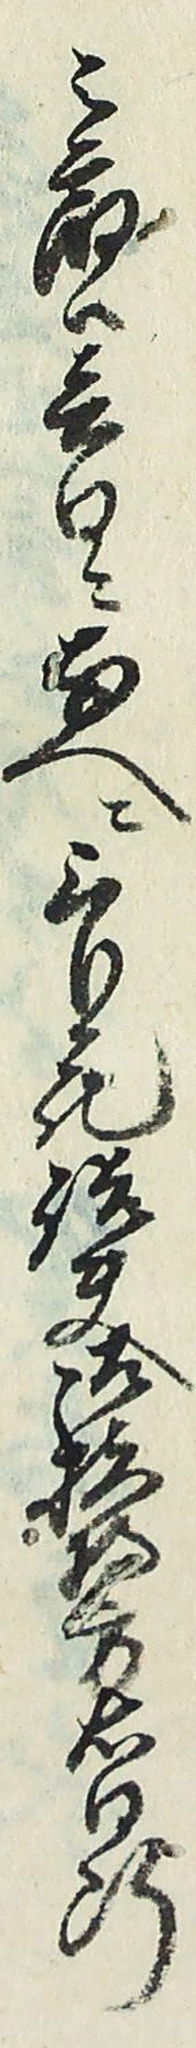の節は一日に両人に三分宛詰夫御扶持方右同断
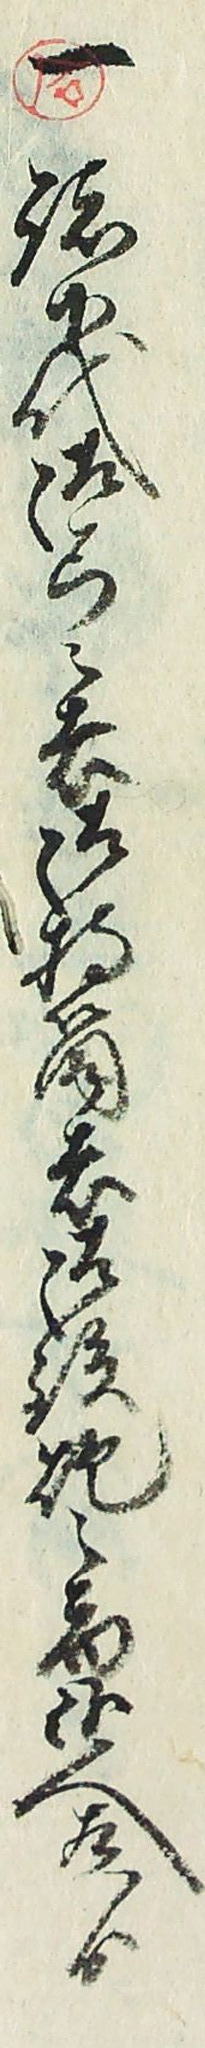一諸下代御弓の者御持筒者御鉄炮の者二人相より
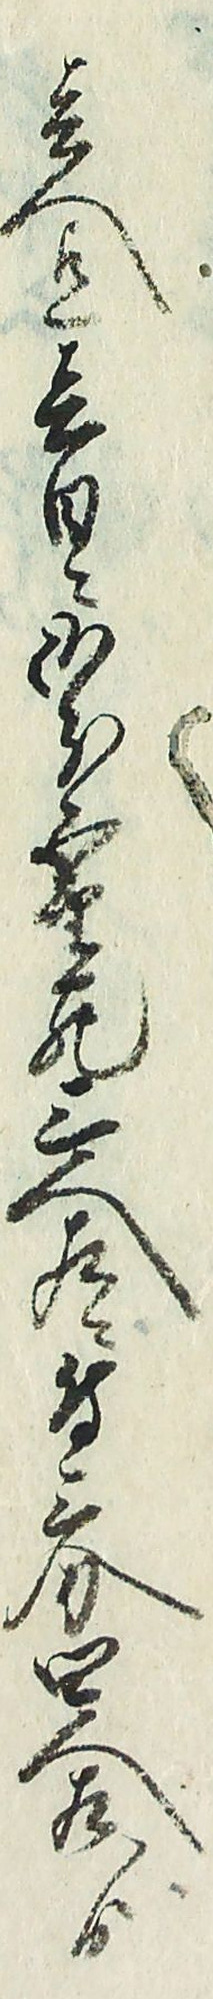一人迄一日に二分五厘宛三人相に付三分四人相より
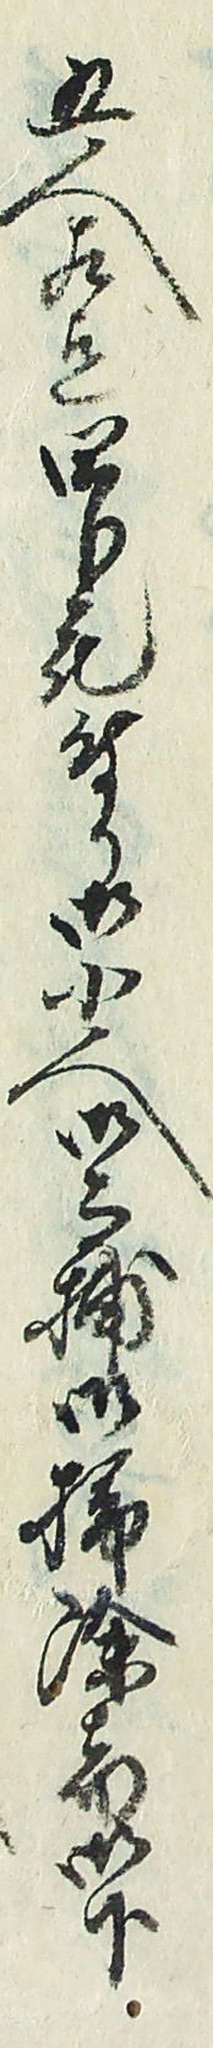五人相迄四分宛付り御小人御鳥捕御掃除者御下
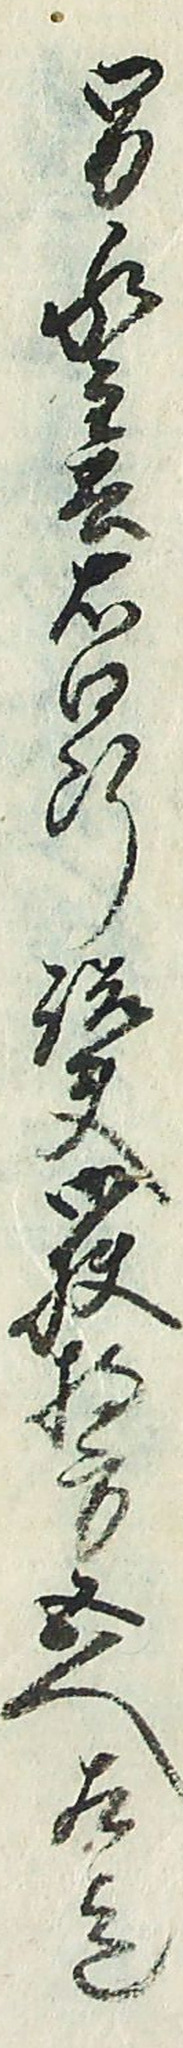男水主共右同断詰夫御扶持方五人相迄
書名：諸割賦物賃銀定記録帳
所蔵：鳴門教育大学 Naruto University of Education
